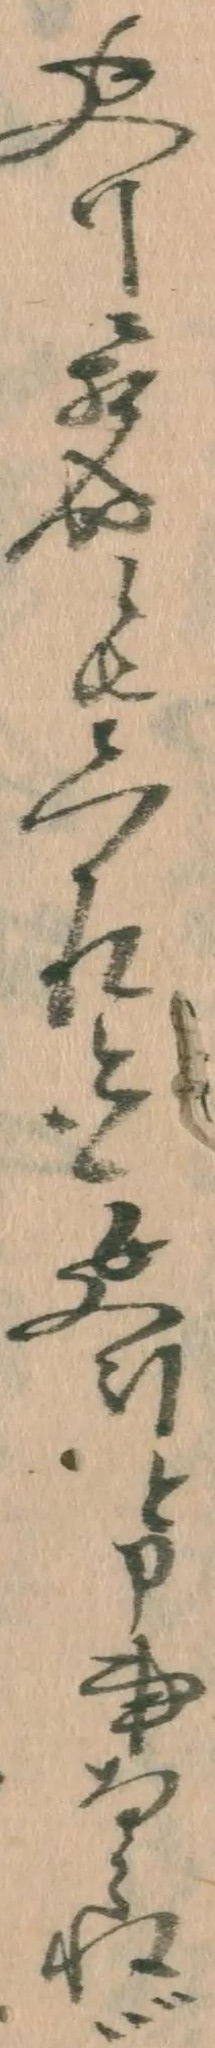延引ニ相成候由しかれとも延引と申事ならねバ
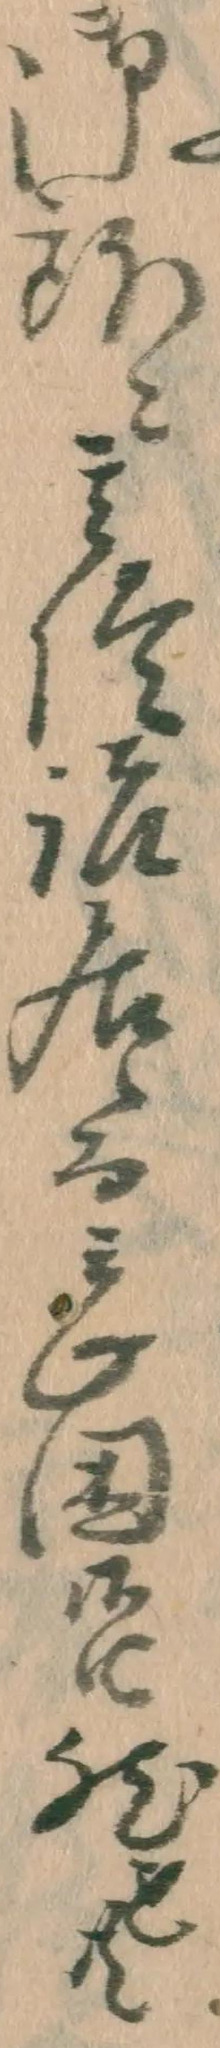御所ニ其侭詰居候而甚困候由然れ共
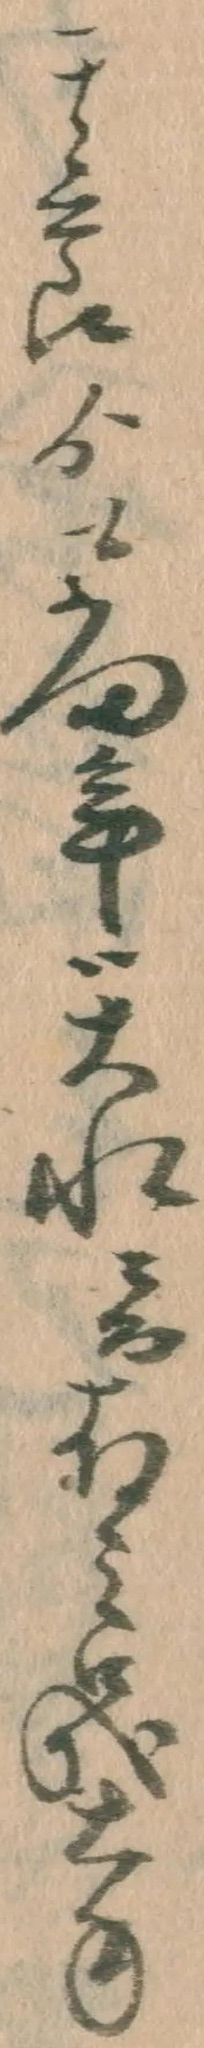其節ゟも当年ハ大水ニ而有之候哉土手
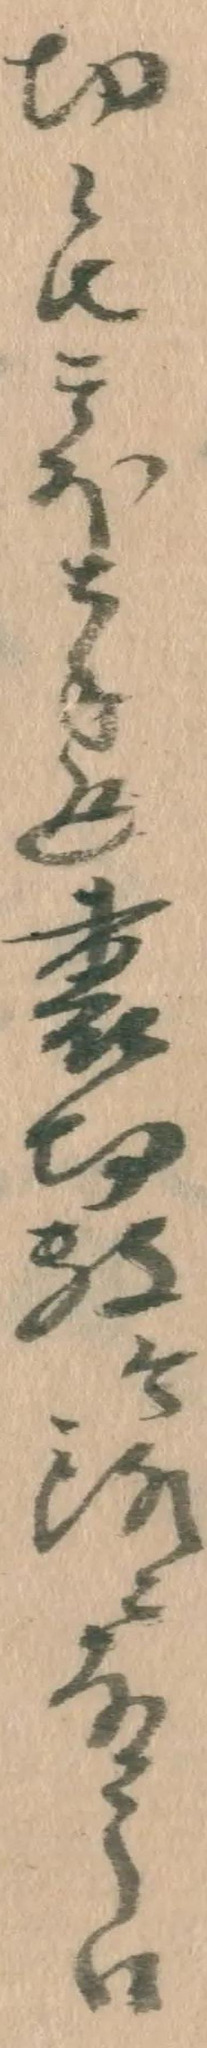切候由其外土手通裏切数ケ所ニ有之候
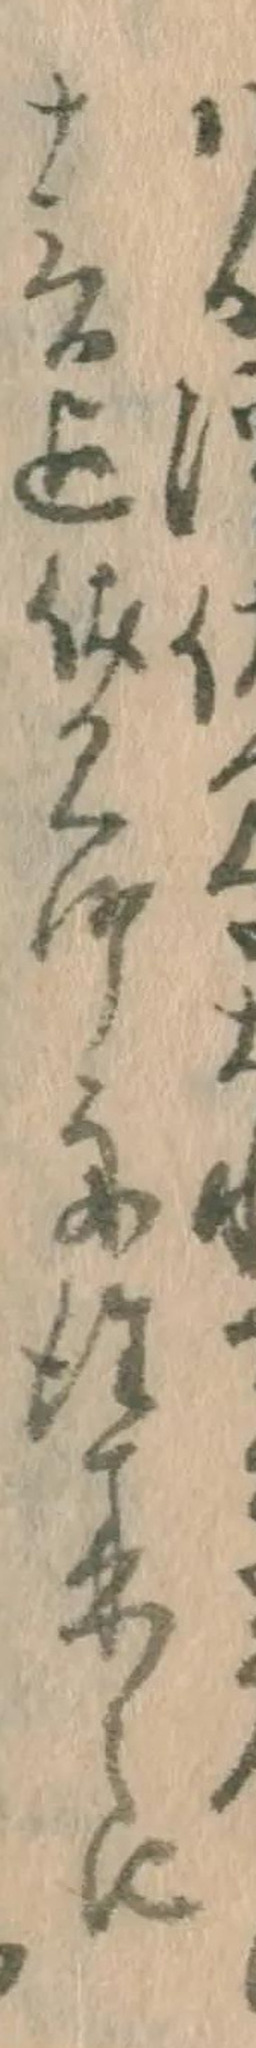十三日迄伏見御舟往来之由
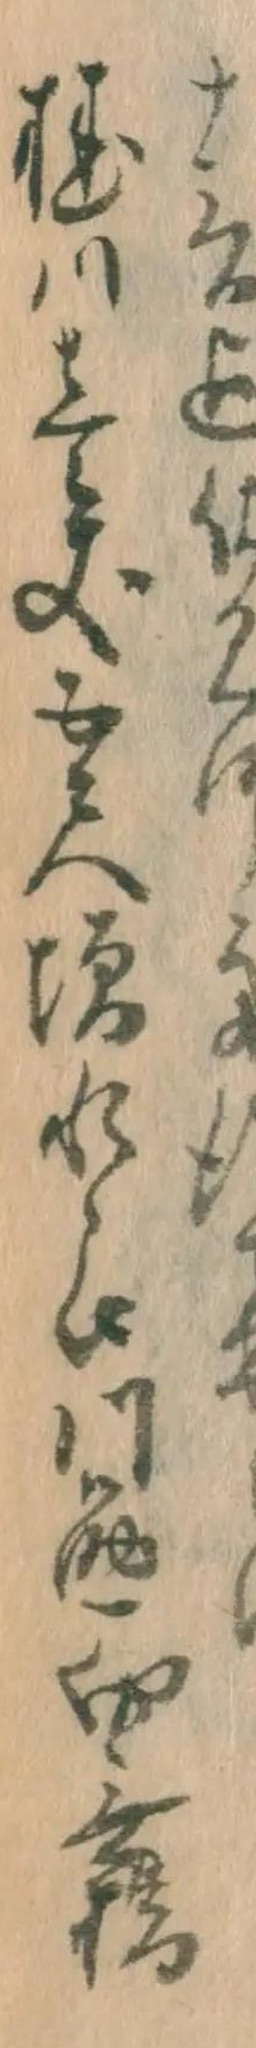桂川壱丈五尺増水候由川筋一切無橋

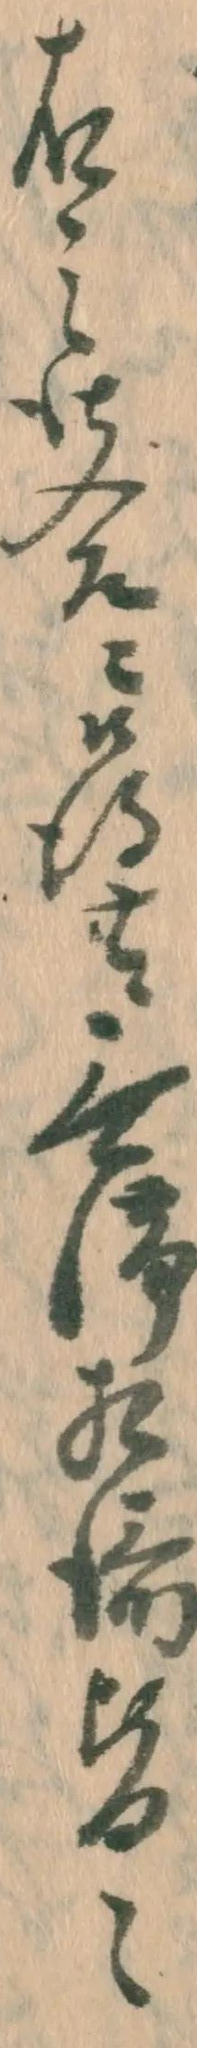右之仕合ニ候得共無滞相済皆々
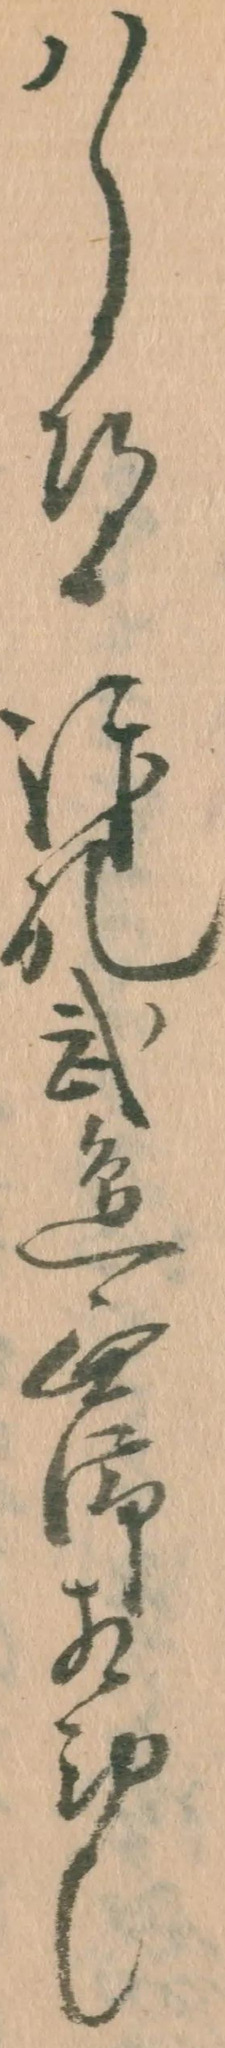八月朔日拝礼武辺無滞相勤申候
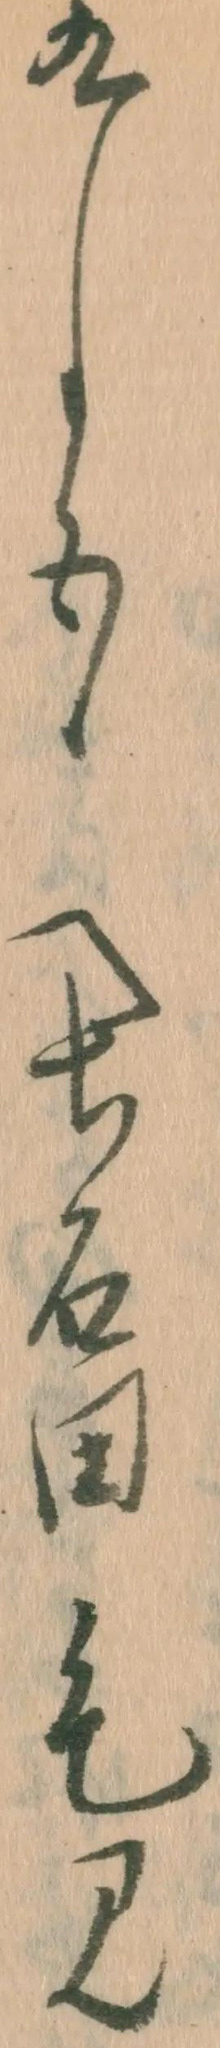九月五日へち石田毛見
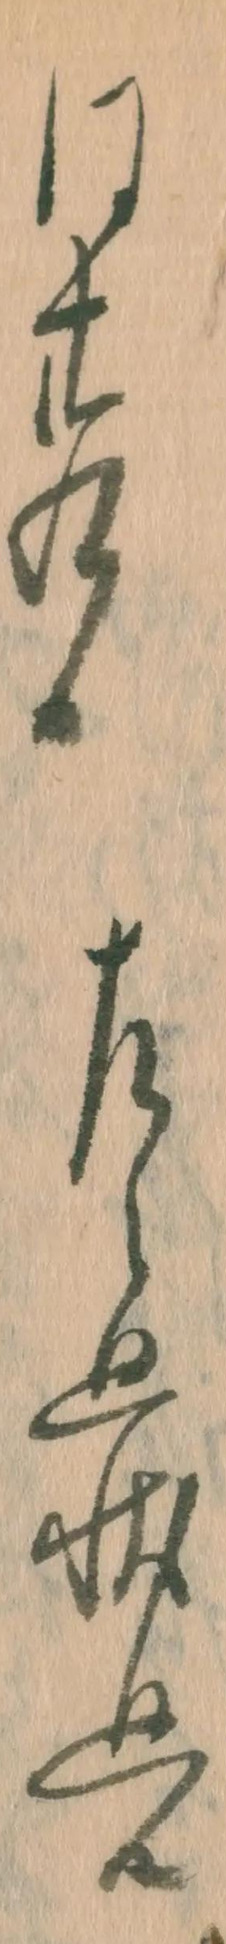同廿九日左之廻状廻ル
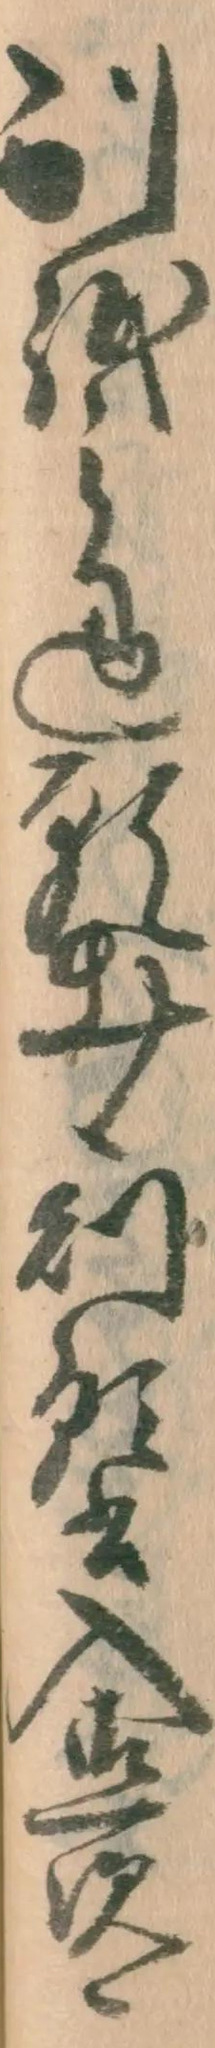別紙之通願出候則願書入御覧候
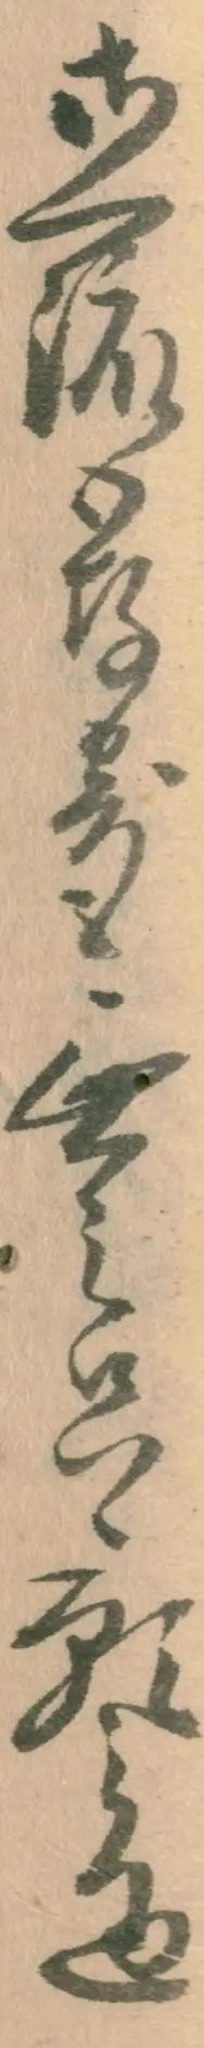御一統御存寄も無之候ハヽ願之通
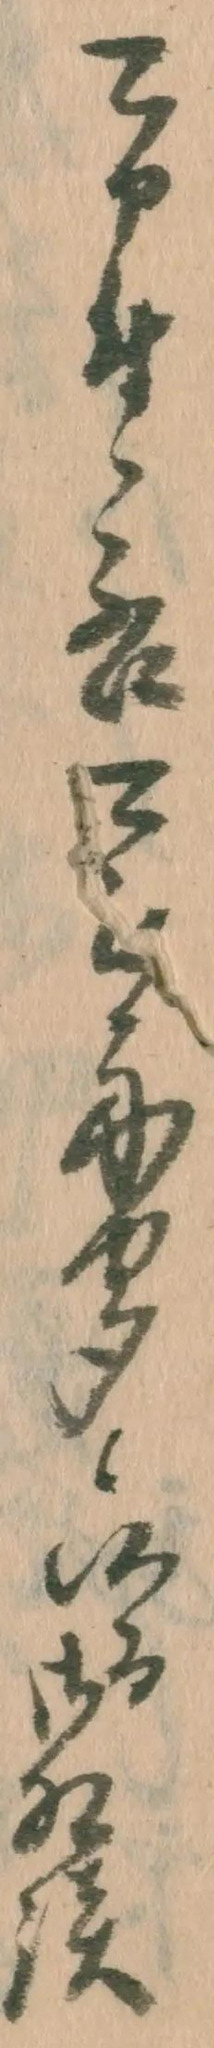可申付候否可被承聞候仍而御相談
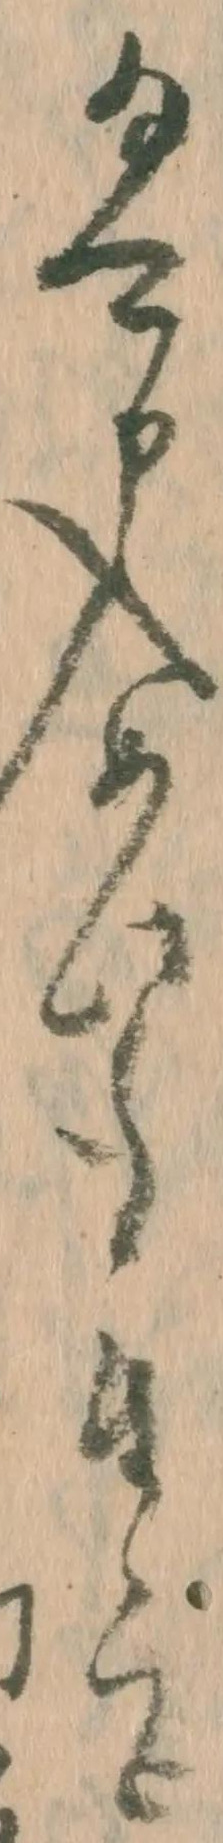為可申入如此座候以上
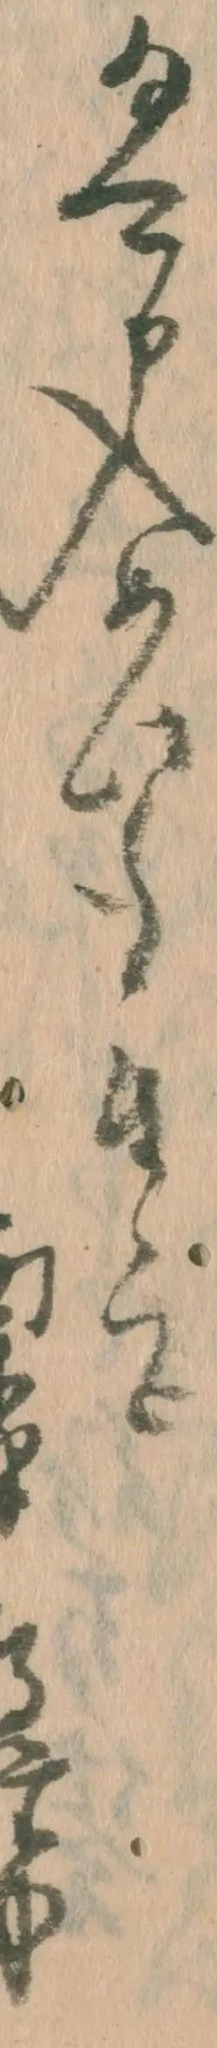為可申入如此座候以上
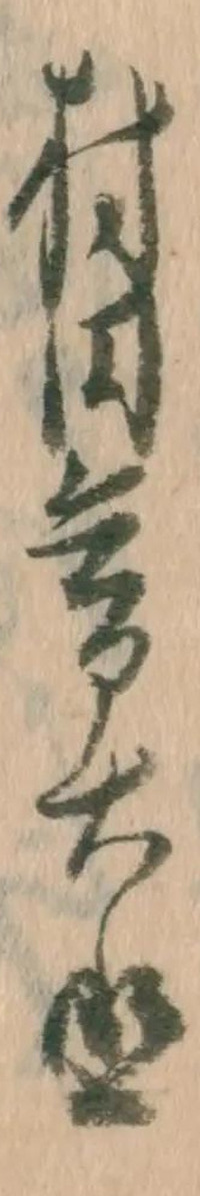村田兵部大丞
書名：賀茂社記録. 第61冊
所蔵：国立国会図書館 National Diet Library, JAPAN
